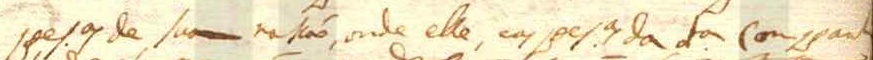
pes.as de sua nassaõ, onde elle, e as pes.as da d̄a Companh
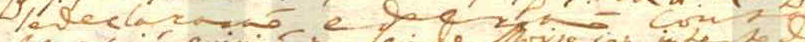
se declararaõ, e deraõ conta
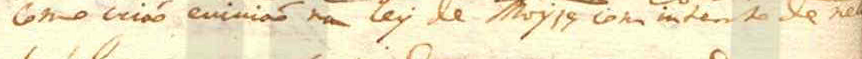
como criaõ e uiuiaõ na ley de Moyzes com intento de ne
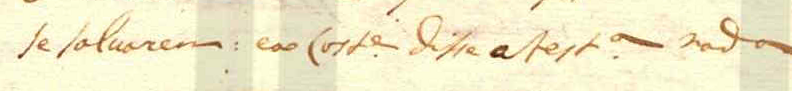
se saluarem: e ao Cost.e disse a test.a nada
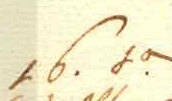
16. ta.
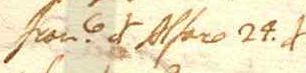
fran.co d̄ Alfaro 24. d̄
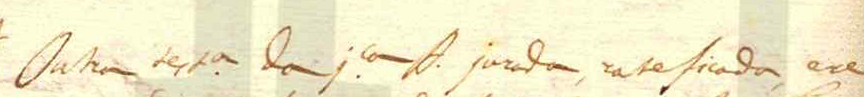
Outra test.a da j.ça A. jurada, rateficada, e re
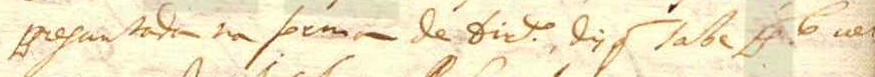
preguntada na forma de dir.to, dis q̄ sabe p̄lo uer
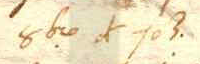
8.bro d̄ 703.
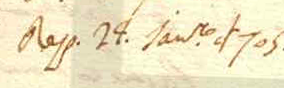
Rep. 24. Ian.ro d̄ 705.
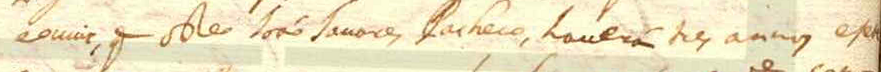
e ouuir, q̄ o Reo Ioaõ Tauares Pacheco, hauerá tres annos e se
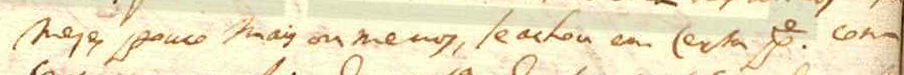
mezes pouco mais ou menos, se achou em Certa pe. com
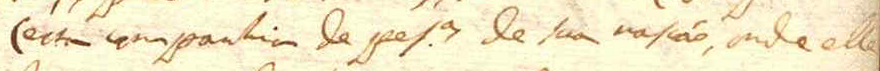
Certa companhia de pes.as de sua nasçaõ, onde elle
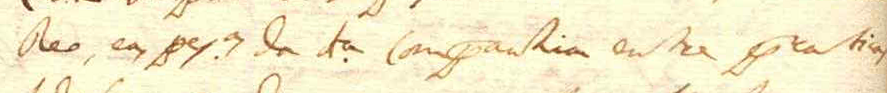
Reo, e as pes.as da d̄.a Companhia entre praticas
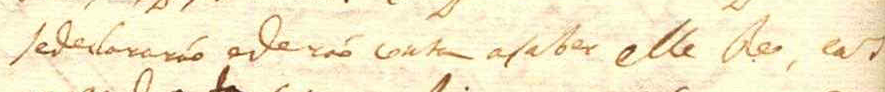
se declararaõ e deraõ conta a saber elle Reo, e as
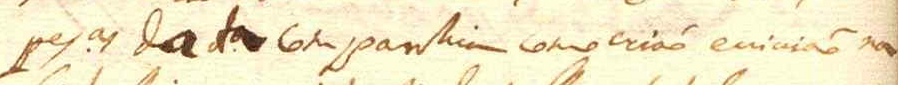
pes.as da d̄.a companhia como criaõ e uiuiaõ na
